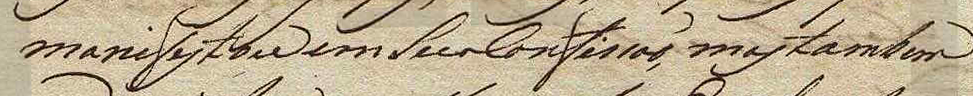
manifestou em sua Confissaõ, mas tambem
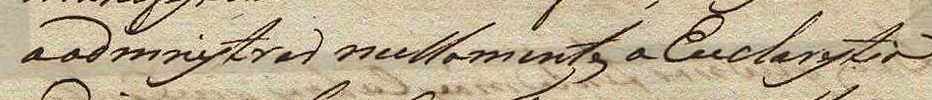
a admnistrar nullamente a Euclarestia
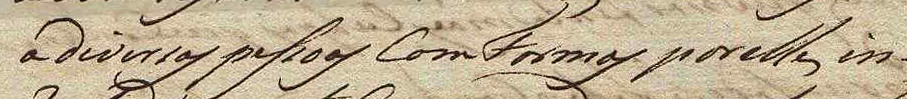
a diversas pessoas Com Formas por elle in
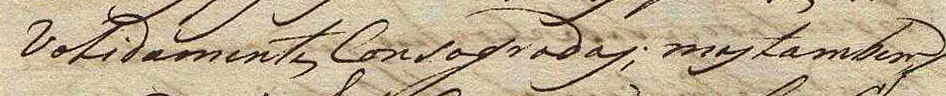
vaLidamente Consagradas; mas tambem
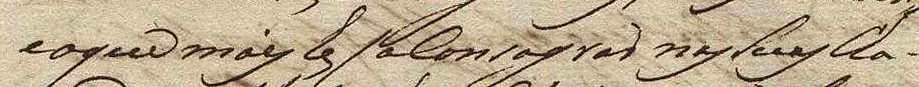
e o que mais he /a Consagrar nas suas Cha
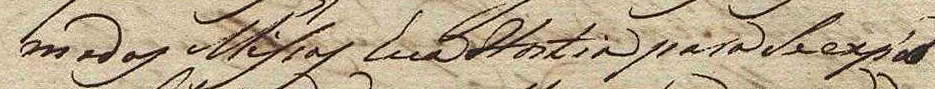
madas Missas hua Hostia para Se expor
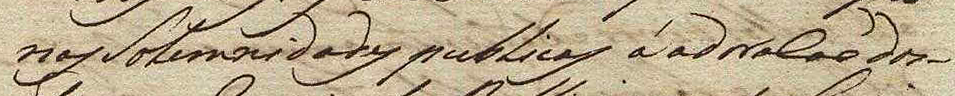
nas Solemnidades publicas á adoraÇaõ dos
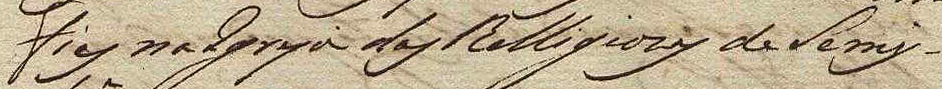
fies na Igreja das Relligiozas de Semy
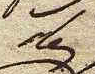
de
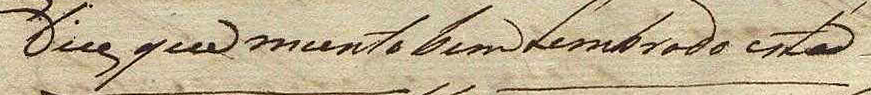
Dice que munto bem Lembrado está
